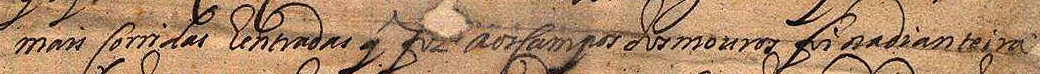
mais Corridas E entradas q̄ fez aos Campos dos mouros foi na dianteira
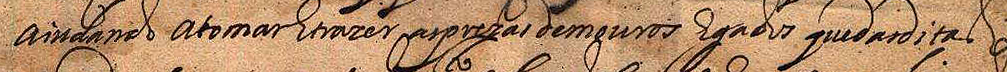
aiudando a tomar E trazer as prezas de mouros E gados que das ditas
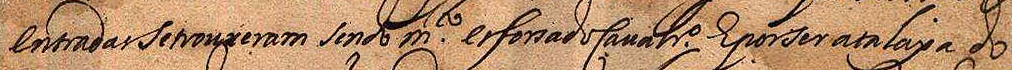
entradas se trouxeram sendo m.to esforsado Caualr.o E por ser atalaya do
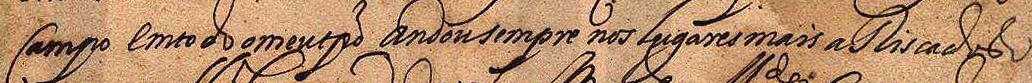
Campo em todo o meu tpō andou sempre nos lugares mais aRiscados
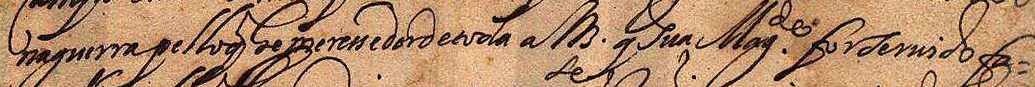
na guerra pello q̄ he meressedor de toda a M. q̄ sua Mag.de for seruido fa
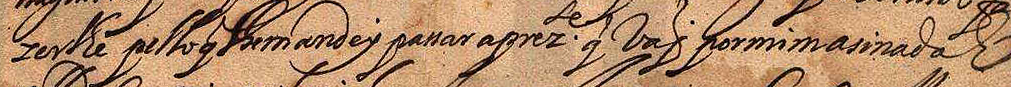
zerlhe pello q̄ lhe mandey passar a prez.te q̄ vaj por mim asinada E
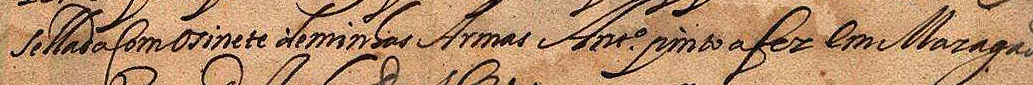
sellada Com o sinete de minhas Armas Ant.o pinto a fez em Mazagaõ
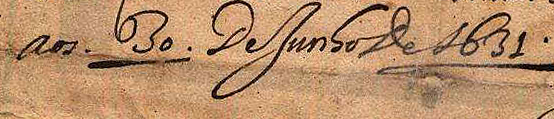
aos. 30. De Junho de 1631.
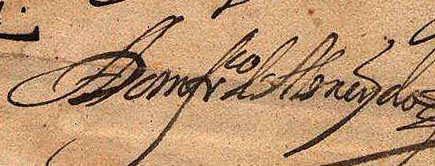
Dom frco de Almeyda
